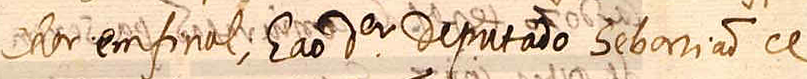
char em final; E ao Dor. deputado Sebastião ce
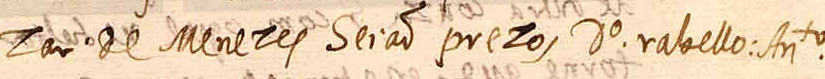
Zar de Menezes seião prezos, Do. rabello: Anto.
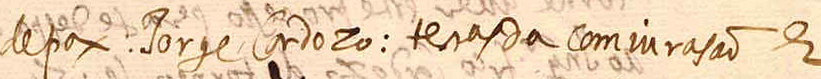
de pax: Iorge Cardozo: testas da comiurasão E
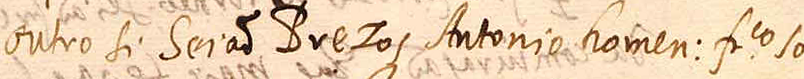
outrosi Seião Prezos Antonio homen: frco so
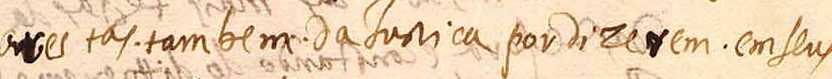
ares tas. tambem da Iustiça por dizerem em seus
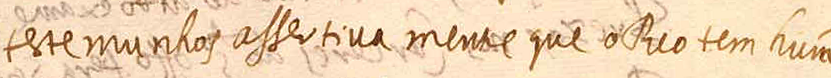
testemunhos assertiuamente que o Reo tem hum
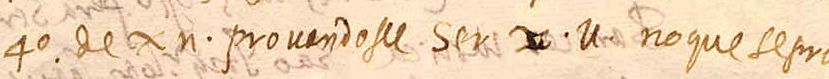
4º de x n. prouandosse ser x. u. no que se pro
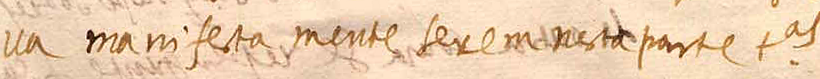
ua manifestamente serem nesta parte t.as
